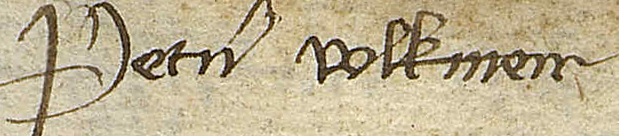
Petn* volkmeir
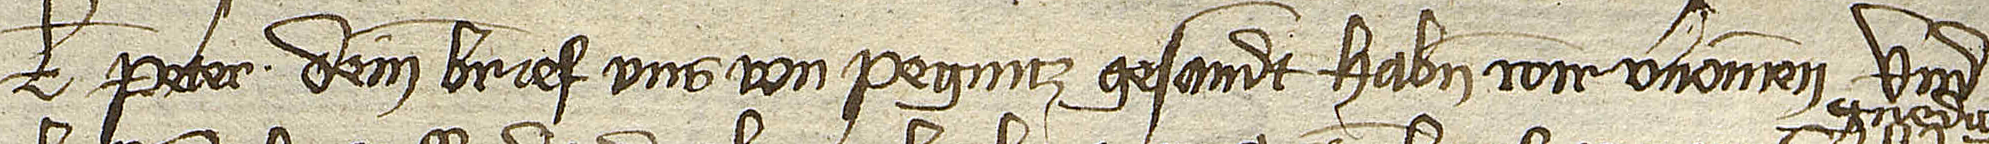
L* Peter . Dein* briefs vns von pegnicʒ geſandt habn* wir v*nom*en Vnd
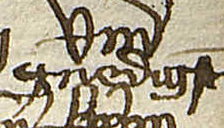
gnediſt*
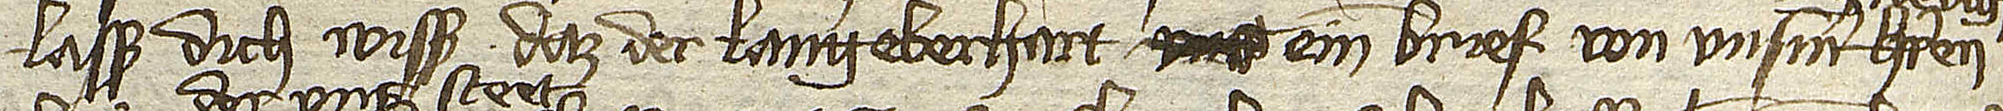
laſſ* dich wiſſ* . daʒ der lang eberhart vns ein* brief von vnſm* h*ren
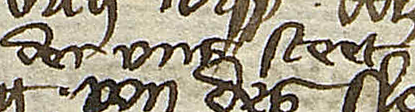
der vns ſteet
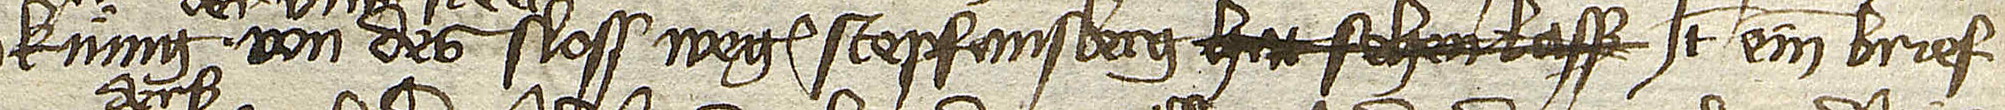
künig . von des ſloſſ weg* ſtepfanſberg hat ſehen laſſ* It* ein* brief
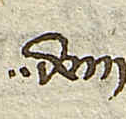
~ dem
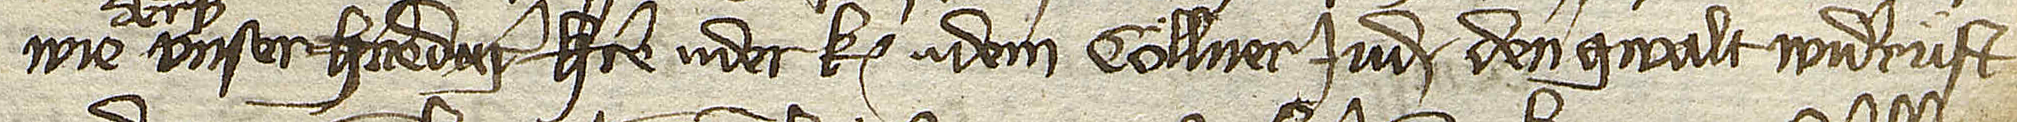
wie vnſer gnedig* h*re ~ der k* ~ dem Cöllner Iud* / den gwalt wid*rüft
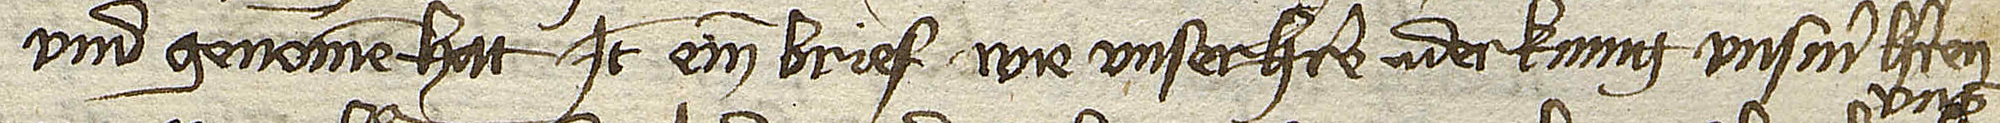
vnd genome* hat It* ein* brief / wie vnſer h*re ~ der kunig vnſm* h*ren
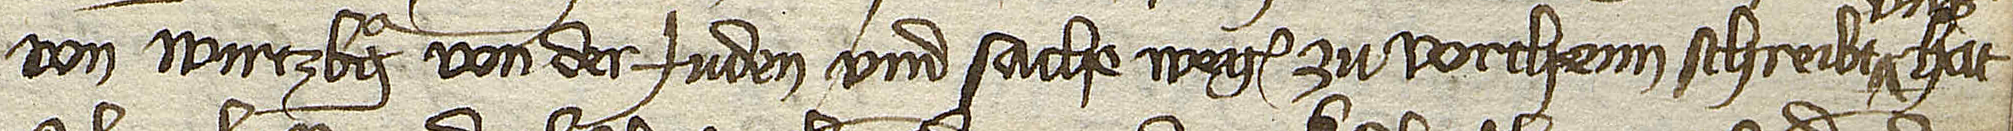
von wircʒb*g von der Iuden vnd ſache weg* ʒu vorcheim ſchreibt hat
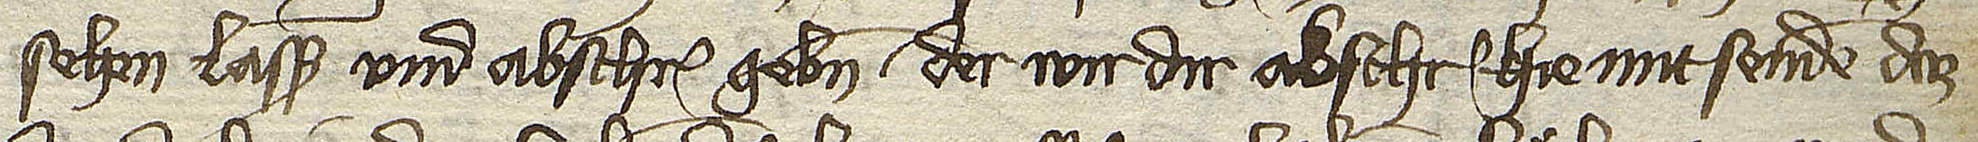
ſehen laſſ* vnd abſchr* gebn* / der wir dir abſchr* hie mit ſende* daʒ
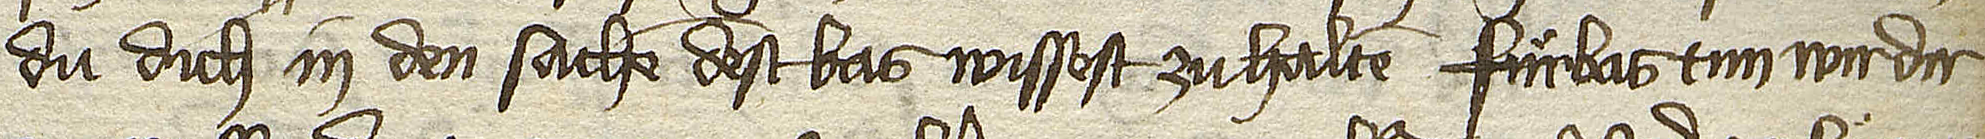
du dich in den ſache* deſt bas wiſſeſt ʒuhalte* fürbas tun wir dir
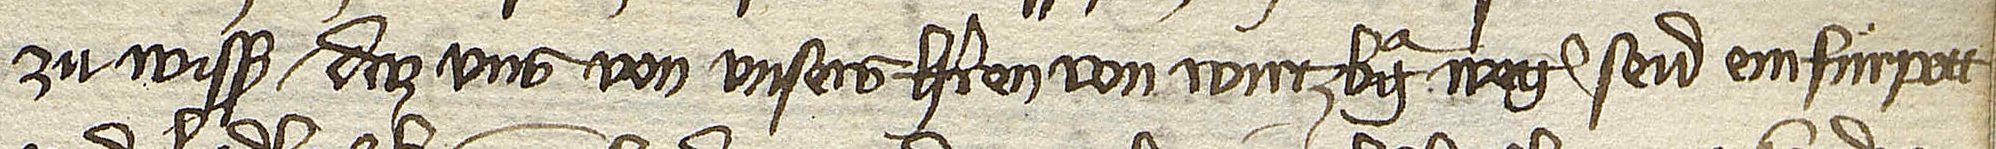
ʒu wiſſ* / Daʒ vns von vnſers h*ren von wircʒb*g weg* ſeid ein fürpott
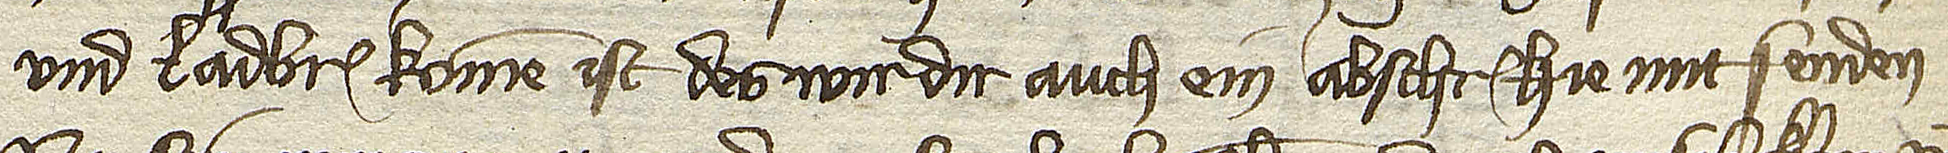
vnd ladbr* kome* iſt des wir dir auch ein abſchr* hie mit ſenden
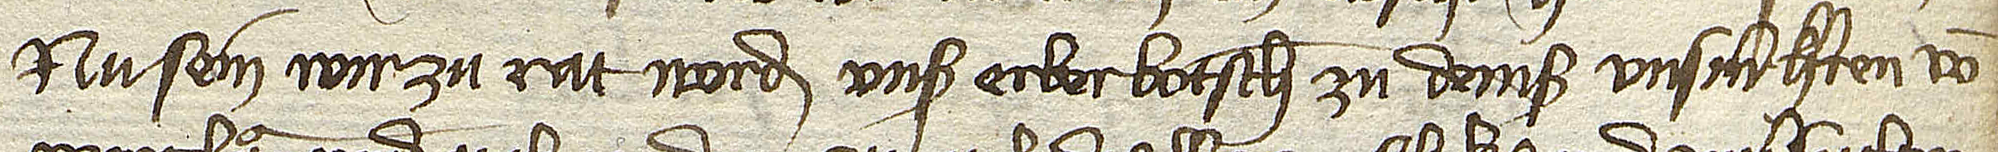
Nu ſein wir ʒu rat word* vnſ* erber botſch* ʒu demſ* vnſm* h*ren vo*
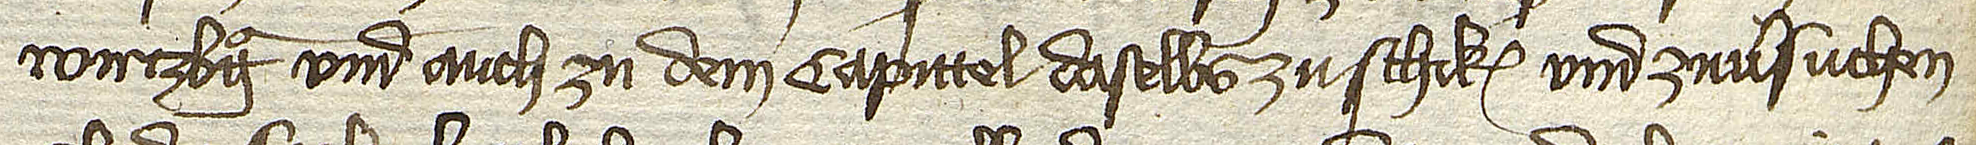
wircʒb*g vnd auch ʒu dem Capittel daſelbs ʒu ſchik* vnd ʒuu*ſuchen
